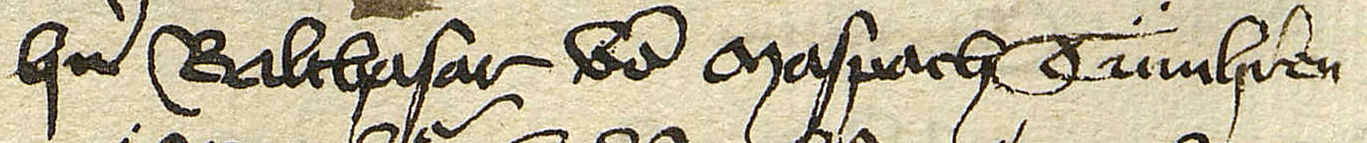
hn* Balthaſar vo* Maſpach Tümhr*en
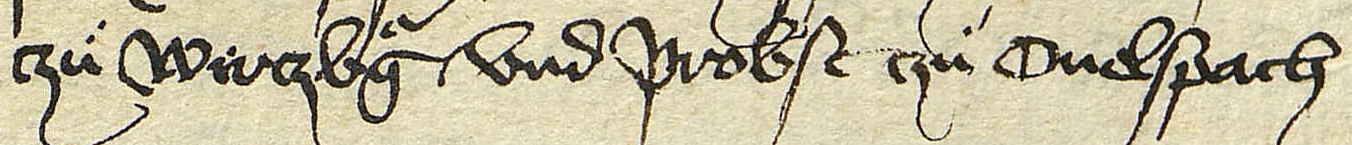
cʒü wircʒb*g / vnd Probſt cʒü Onelſpach
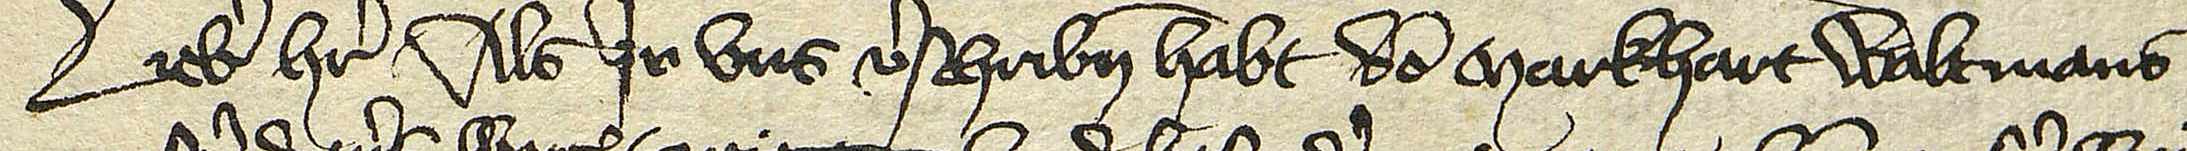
Lieb* hr* / Als Ir vns v*ſchribn* habt vo* Markhart Waltmans
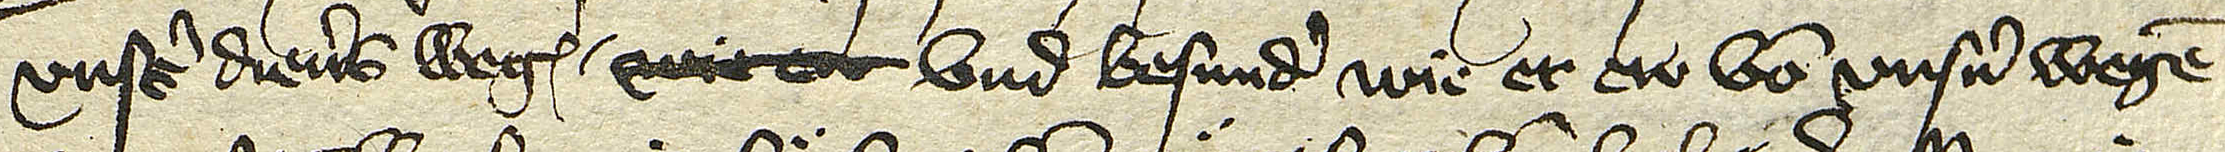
vnſs* dien*s weg* / wie ew vnd beſund wie er ew vo* vnſn* wege*
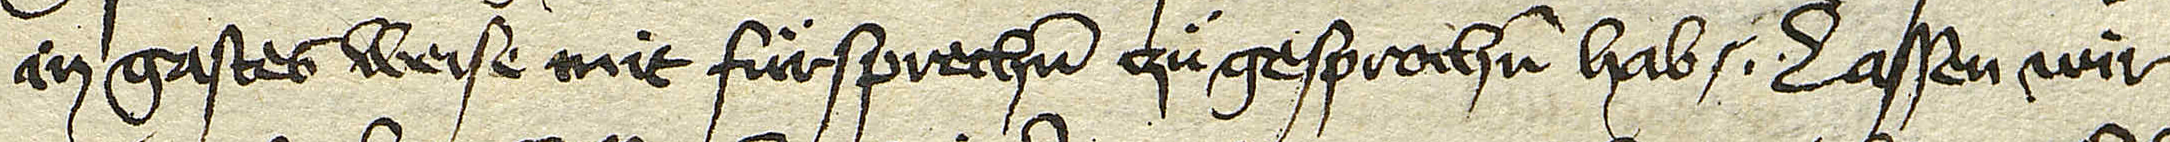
in gaſtes weiſe mit fürſprechn* cʒü geſprochn* hab / . Laſſen wir
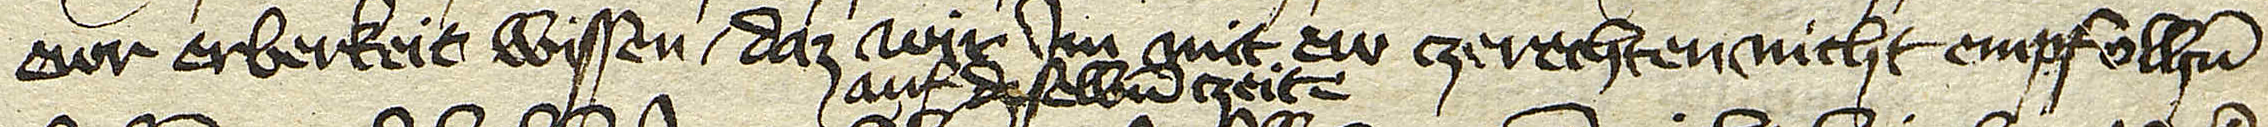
ewr erberkeit wiſſen / daʒ wir Im mit ew cʒerechten nicht empfolhn*
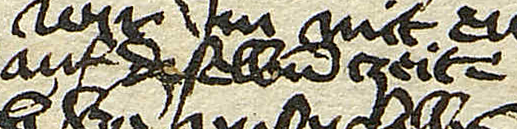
auf diſelbn* cʒeite
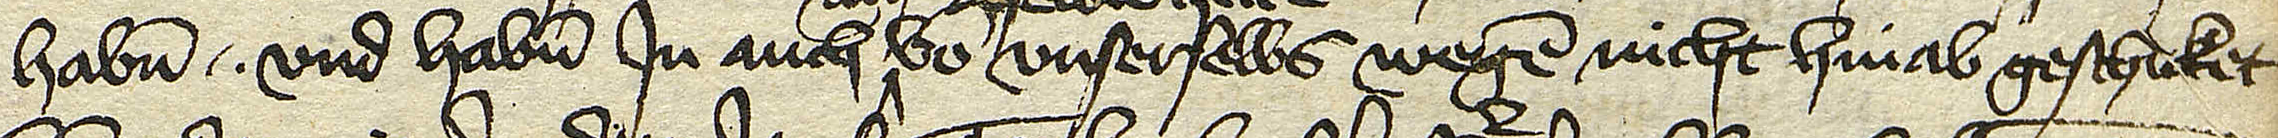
habn* / . vnd habn* In auch vo* vnſerſelbs wege* nicht hinab geſchicket
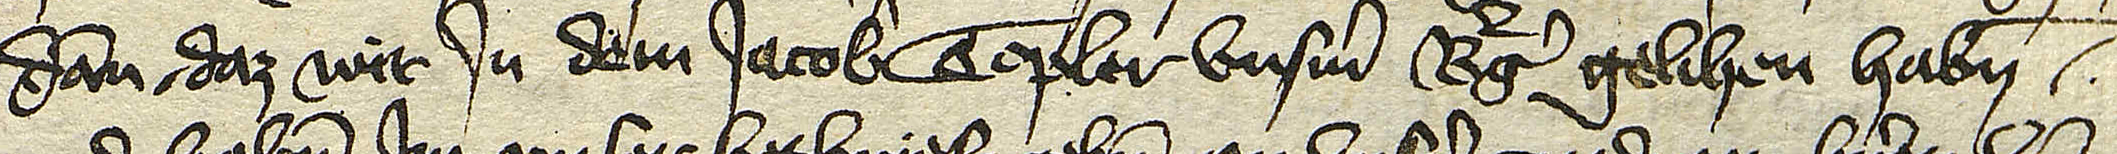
Dan* / daʒ wir In dem Iacob Topler vnſm* B*g* gelihen habn* / .
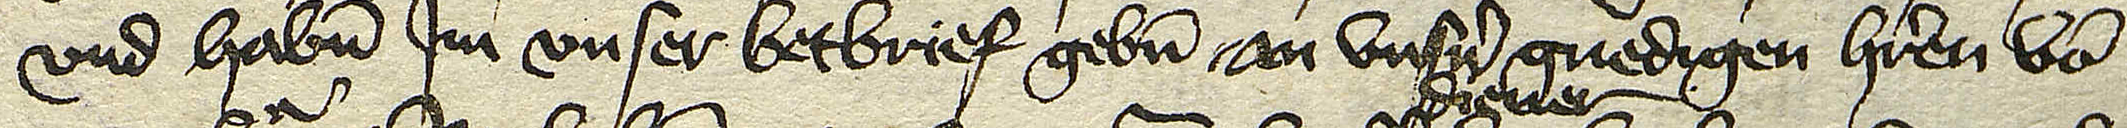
vnd habn* Im vnſer betbrief gebn* / an vnſn* gnedigen hr*en vo*
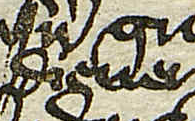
diener
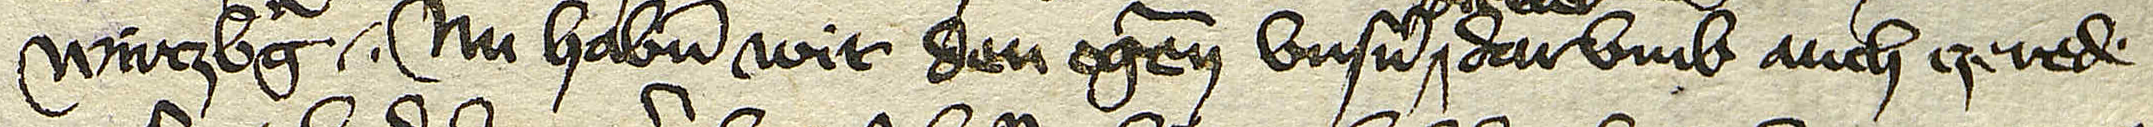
wircʒb*g / . Nu habn* wir den egen* vnſn* darvmb auch cʒerede
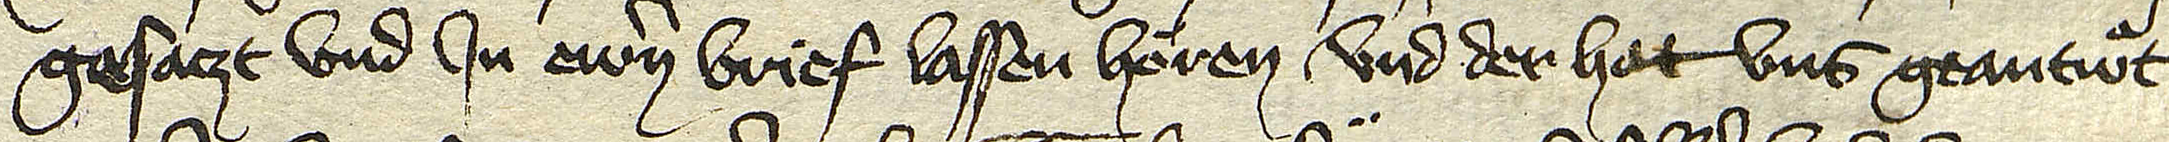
geſacʒt vnd In ewn* brief laſſen hören / vnd der hat vns geantw*t
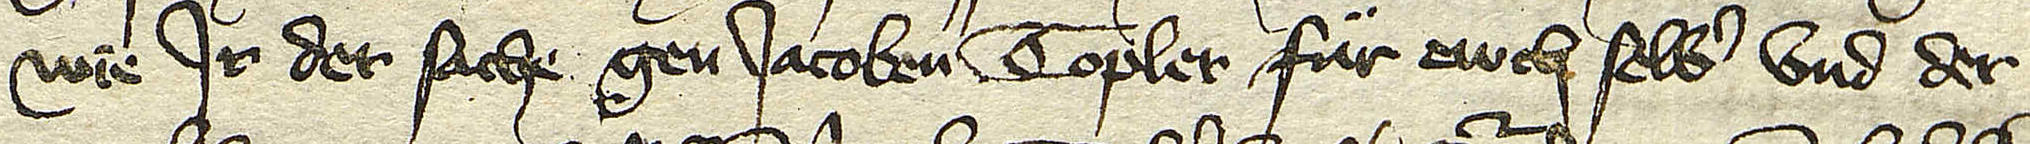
wie Ir der ſache gen Iacoben Topler / für ewch ſelb* vnd der
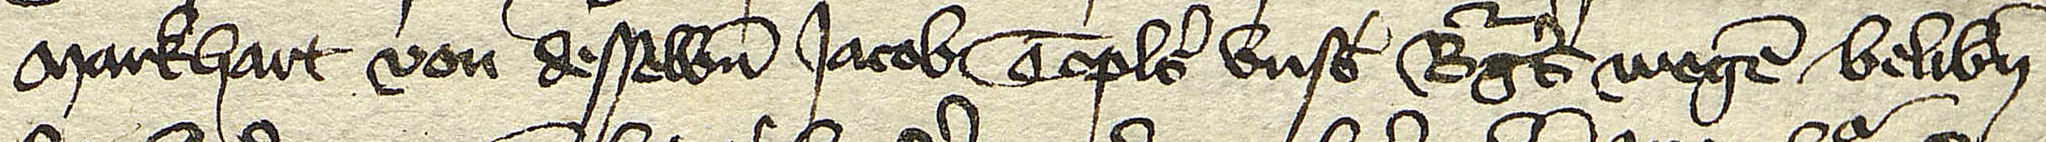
Markhart von deſſelbn* Iacob Topls* vnſs* B*g*s wege* / belibn*
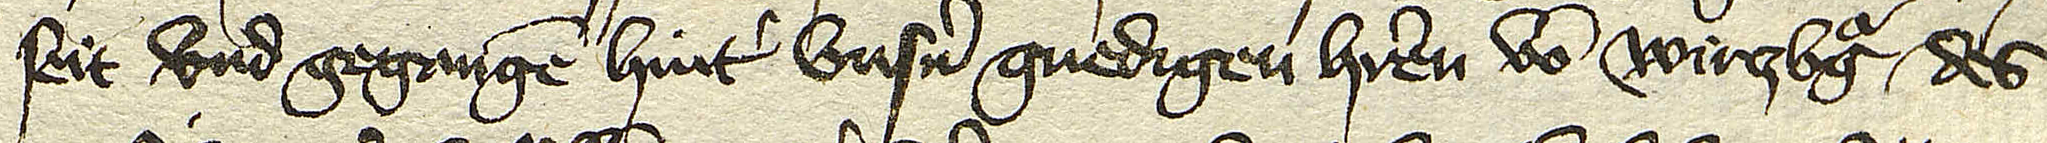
ſeit vnd gegange* hint* vnſn* gnedigen hr*en vo* wircʒb*g / des
